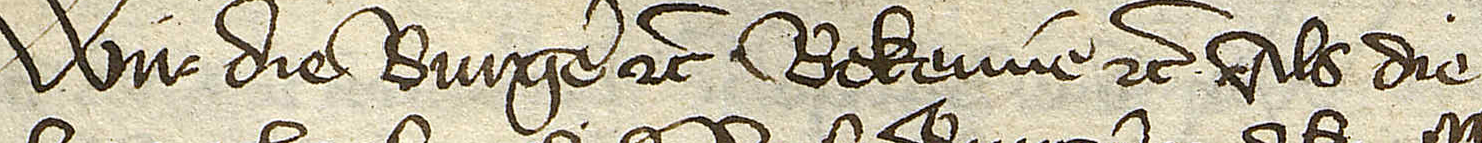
Wir die Burge* ec* Bekenne* ec* Als die
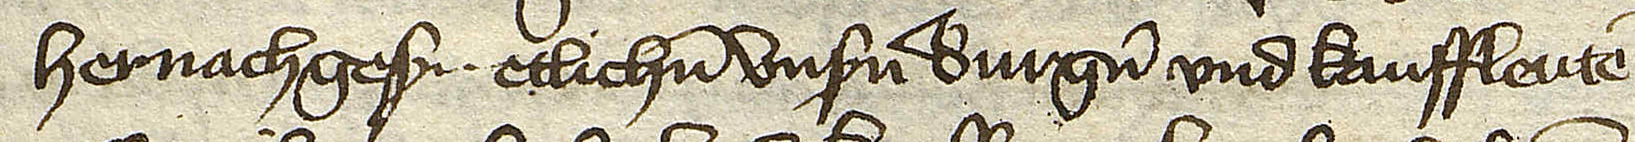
hernachgeſ* ~ etlichn* vnſn* Burgn* vnd kauffleute*
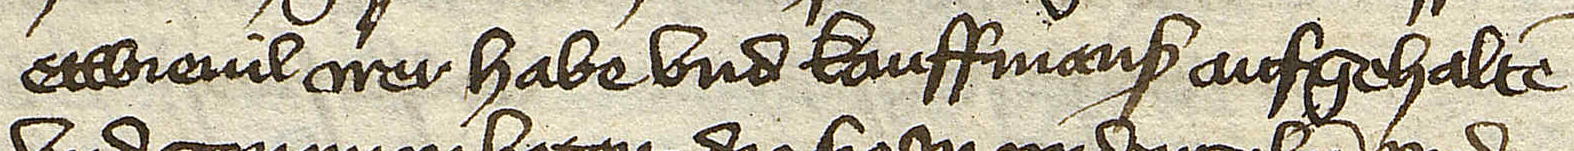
etwieuil irer habe vnd kauffmanſ* aufgehalte*
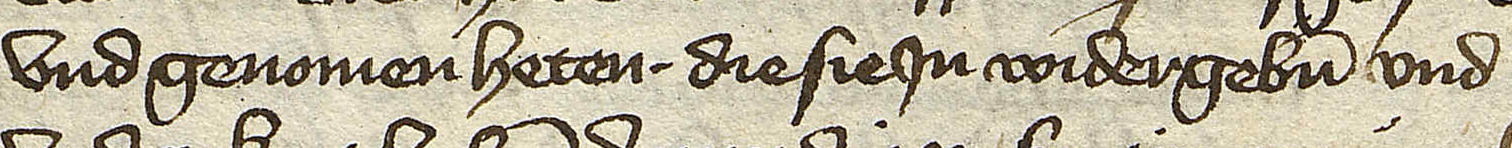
vnd genomen heten . die ſie In widergebn* vnd
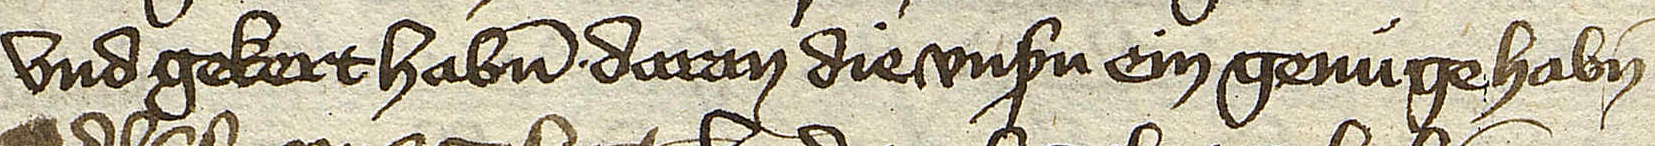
vnd gekert habn* . daran die vnſn* ein genüge habn*
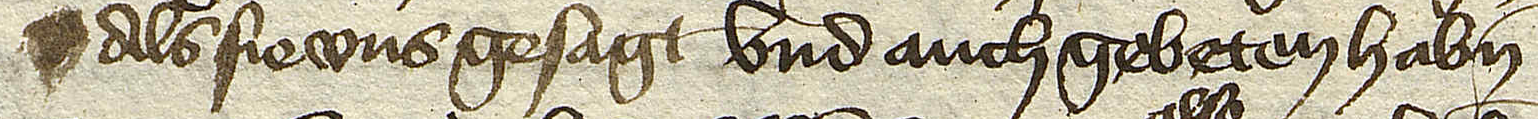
Als ſie vns geſagt vnd auch gebeten habn*
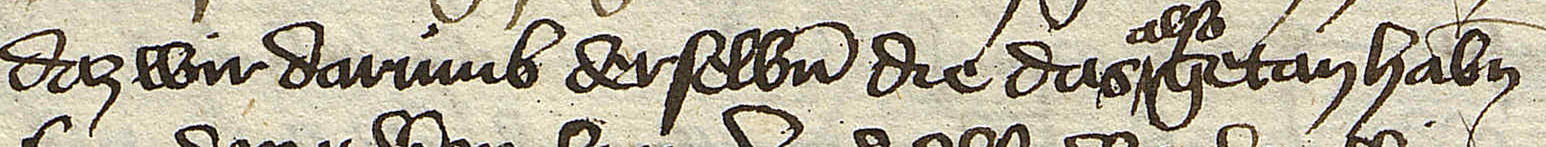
daʒ wir darümb derſelbn* die das getan habn*
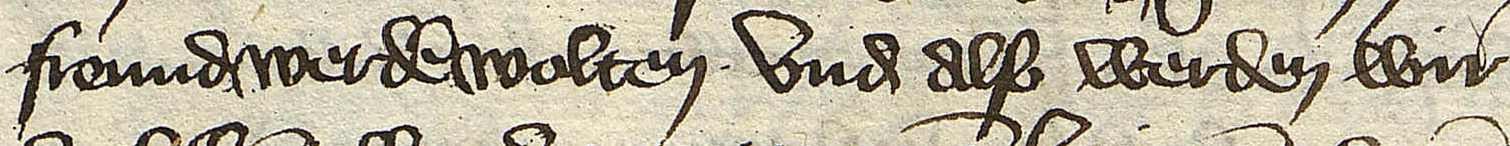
freund werd* wolten . Vnd Alſo werden wir
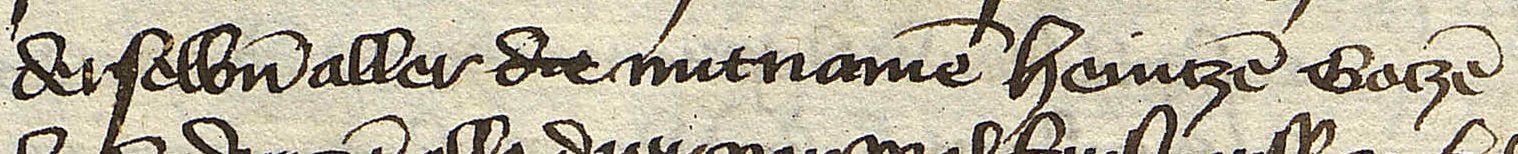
derſelbn* aller die mitname* Heincʒe* Gocʒe*
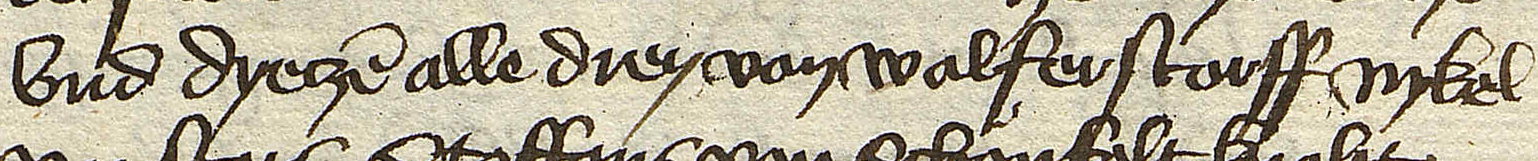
vnd dyecʒe* alle drey von wolferſtorff Nykel
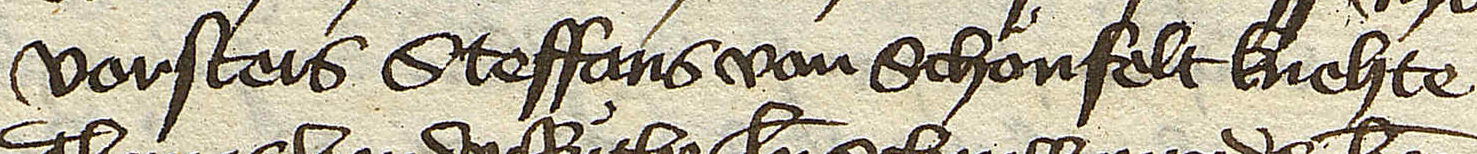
Vorſters Steffans von Schönfelt knehte
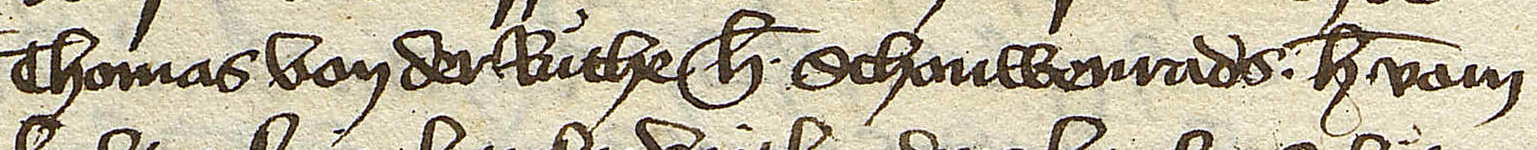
Thomas von der Rüche H* . Schonwenrads . h* vom
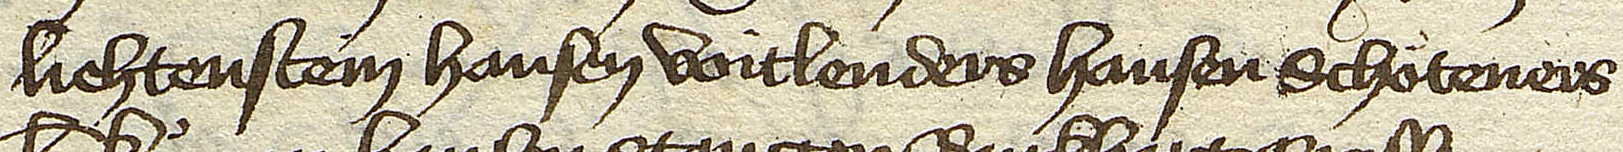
liehtenſtein hanſen voitlenders hanſen Schöteners
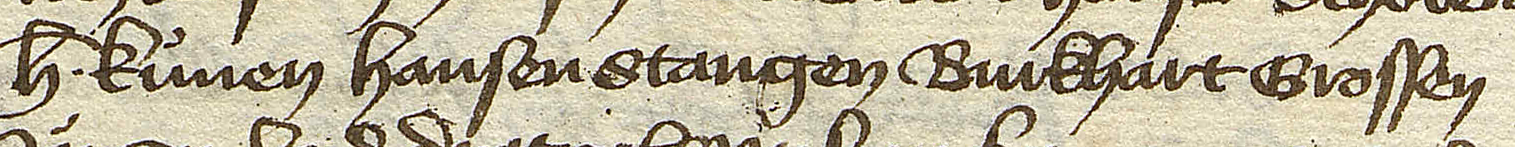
h* . künen hanſen Stangen Burkhart Groſſen
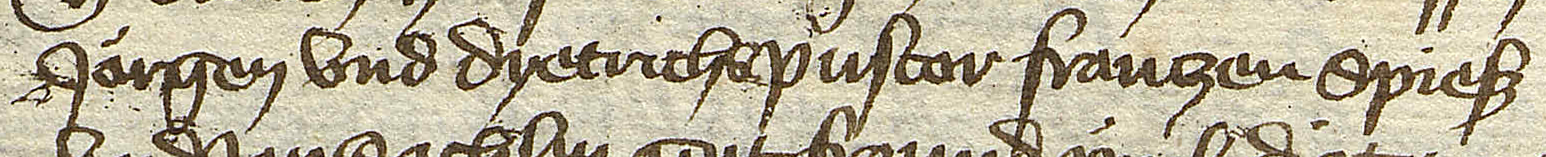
Iörgen vnd dyetrichs puſtor francʒen Spieſʒ
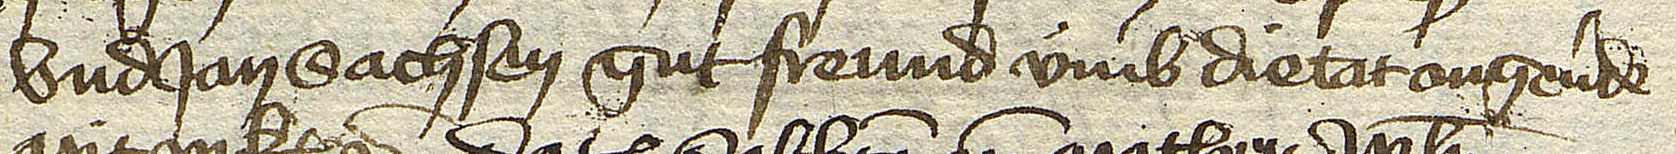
vnd Ian Sachſen gut freund v̈mb die tat ongeu*de
